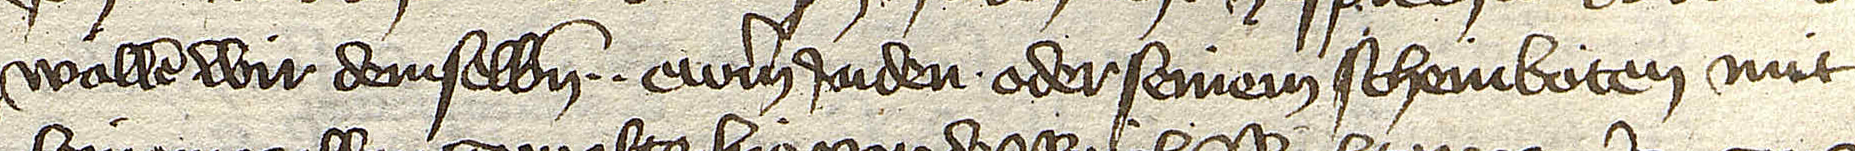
wölle* wir demſelbn* ~ ew*m Iuden . oder ſeinem ſcheinboten mit
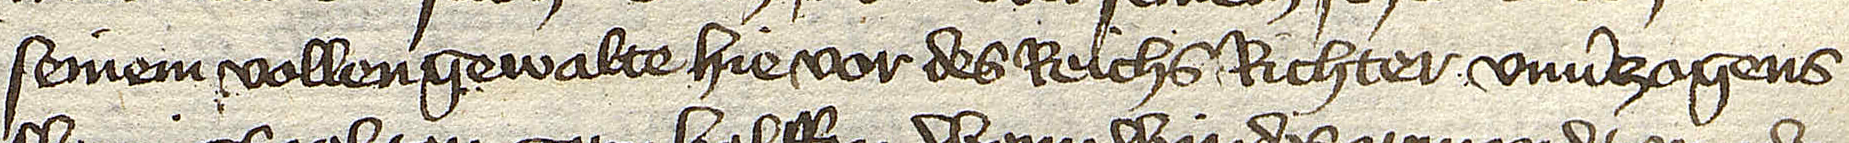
ſeinem vollen gewalte hie vor des Reichs Richter vnu*cʒogens
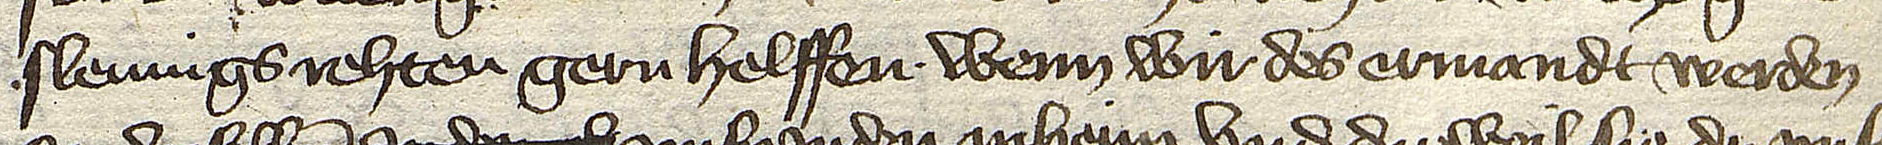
ſleunigs rehten gern helffen . wenn wir des ermandt werden
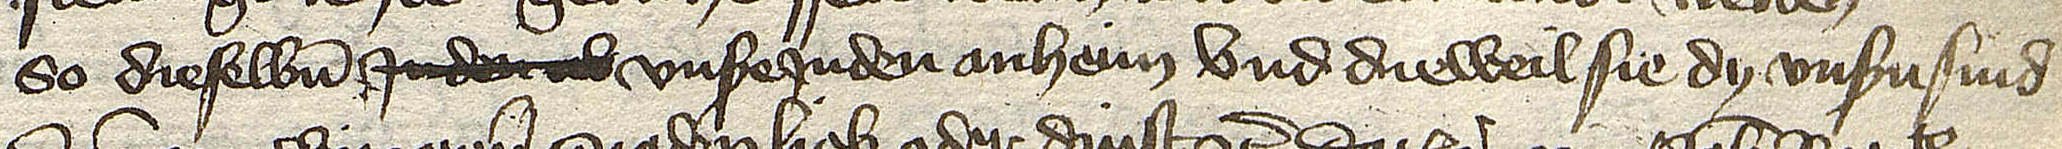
So dieſelbn* Iuden ab vnſ*e Iuden anheim Vnd dieweil ſie dy vnſ*n ſind
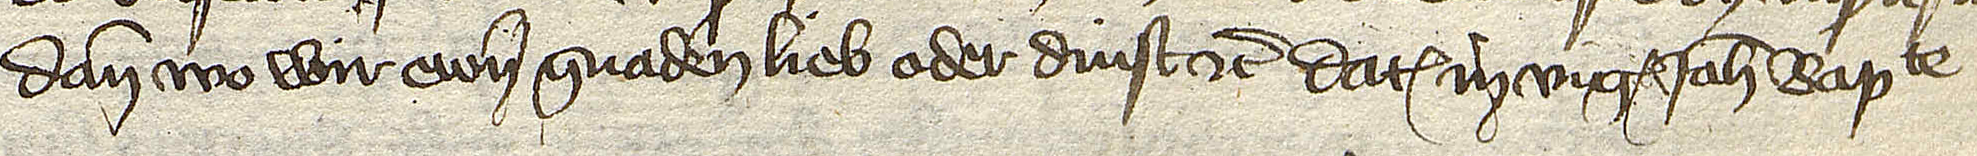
dan* wir ew*n gnaden lieb oder dinſt ec* Dat* in* vig* Ioh* Bap*
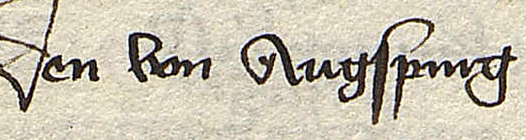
Den von Augſpurg
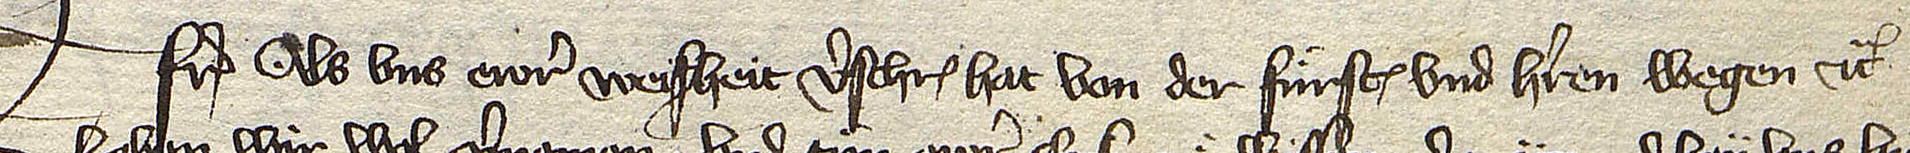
L* fr* . Als vns ewr* weiſ*heit v*ſchr* hat von der fürſt* vnd h*ren wegen ec*
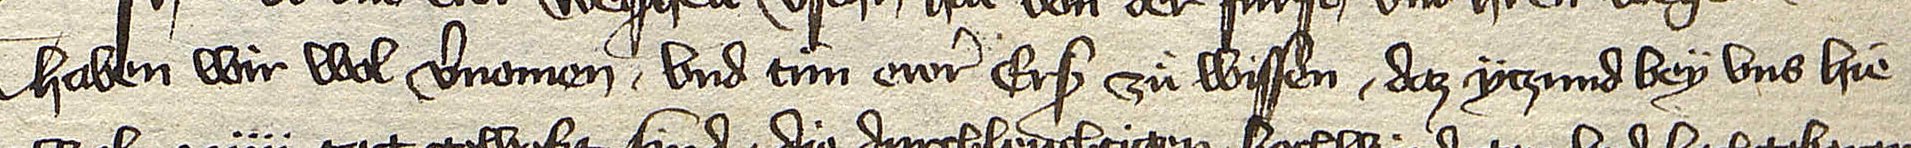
haben wir wol v*nomen / Vnd tün ewr* Erſ* cʒü wiſſen / daʒ ycʒund bey vns hie
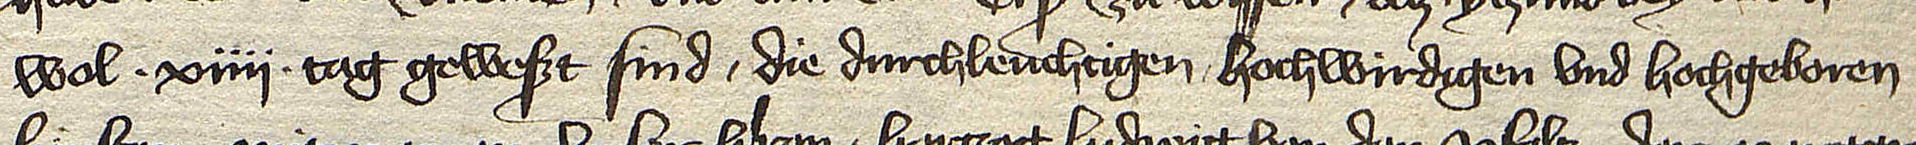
wol . xiiii . tag geweſʒt ſind / die durchleuchtigen / hochwirdigen vnd hochgeboren
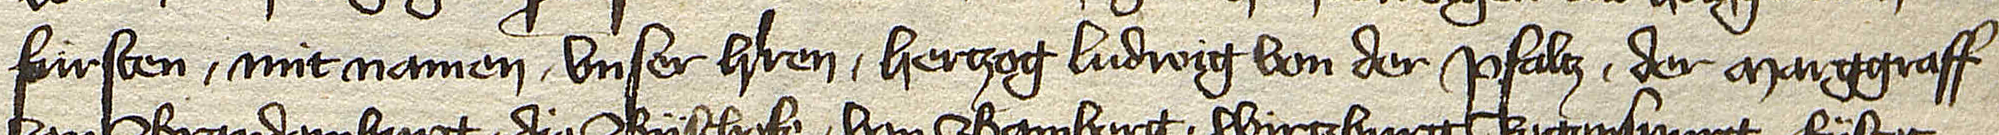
fürſten / mit namen / vnſer h*ren / hercʒog Ludwig von der Pfalcʒ / der Marggraff
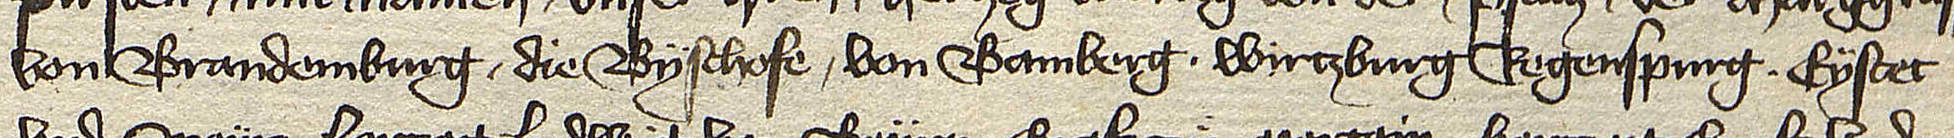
von Brandenburg / die Byſchofe / von Bamberg . wircʒburg Regenſpurg . Eyſtet
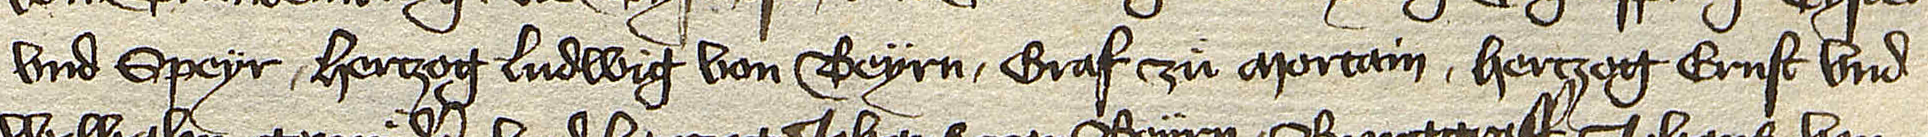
vnd Speyr / hercʒog Ludwig von Beyrn / Graf cʒü Mortani / hercʒog Ernſt vnd
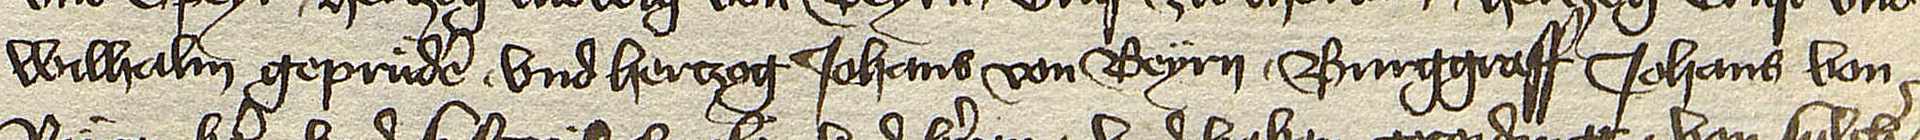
Wilhalm geprüde* / vnd hercʒog Iohans von Beyrn / Burggraff Iohans von
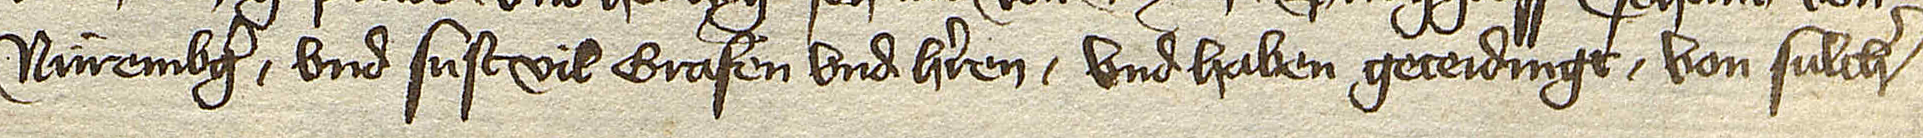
Nüremb*g / vnd ſuſt vil Grafen vnd h*ren / vnd haben geteidings / von ſulch*
